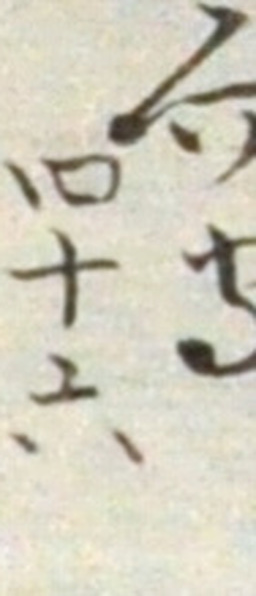四十六
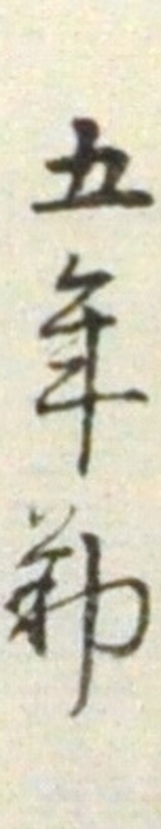五年勤
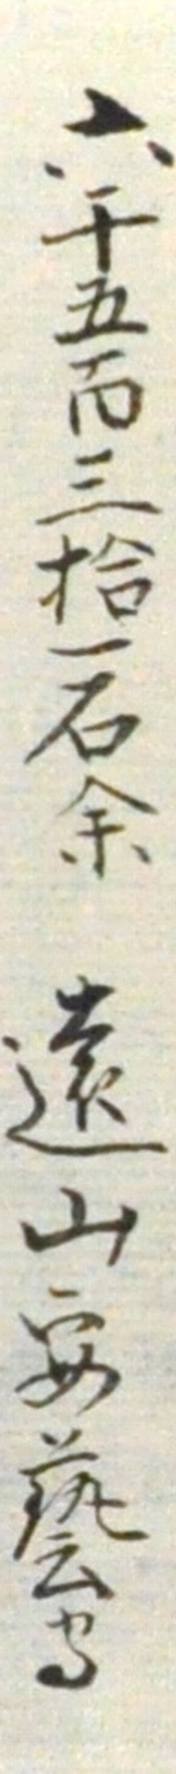六千五百三拾一石余遠山安芸守
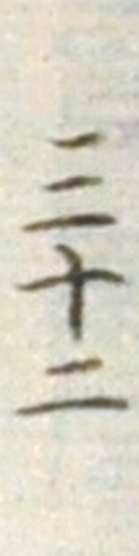三十二
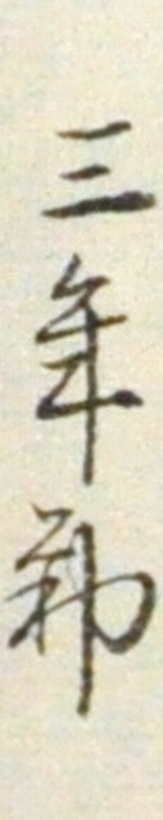三年勤

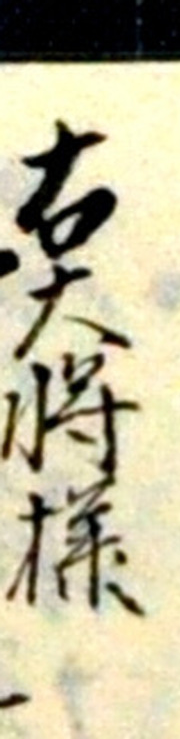右大将様

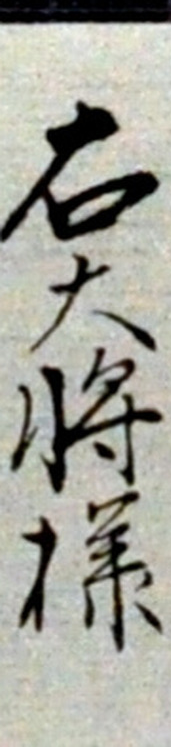右大将様
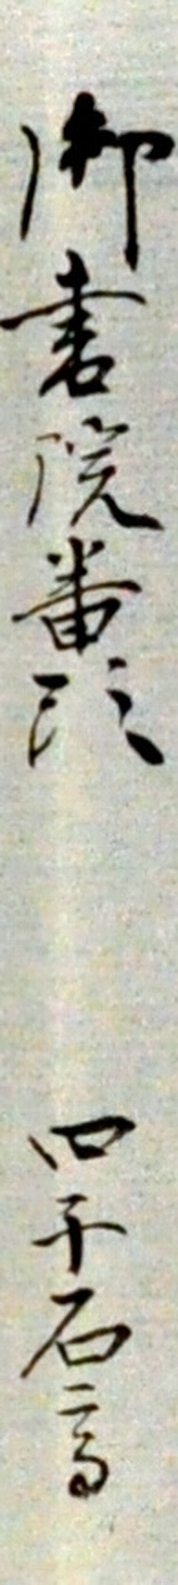御書院番頭四千石高
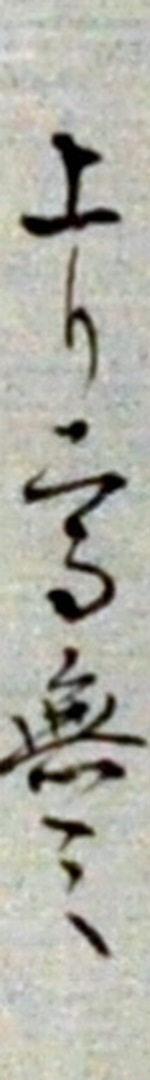上り高無之
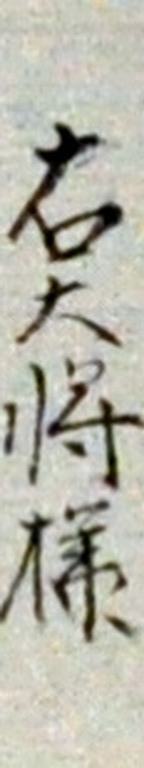右大将様
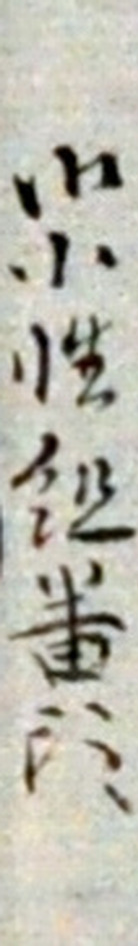御小姓組番頭
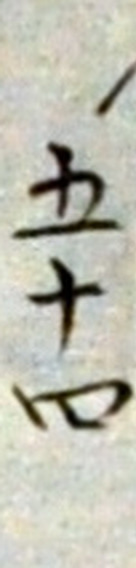五十四
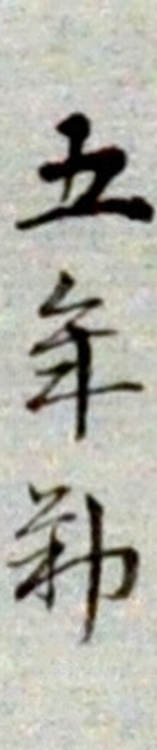五年勤
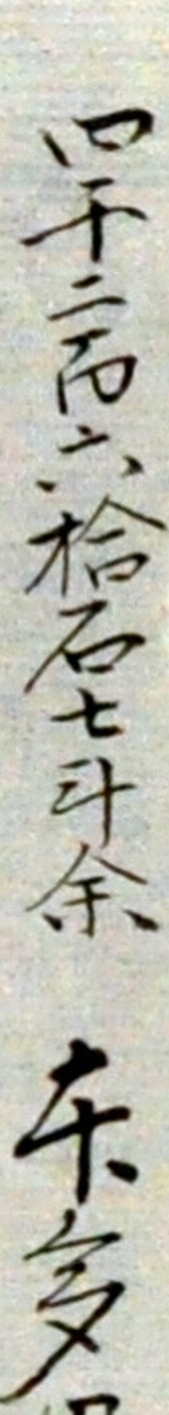四千二百六拾石七斗余本多日向守
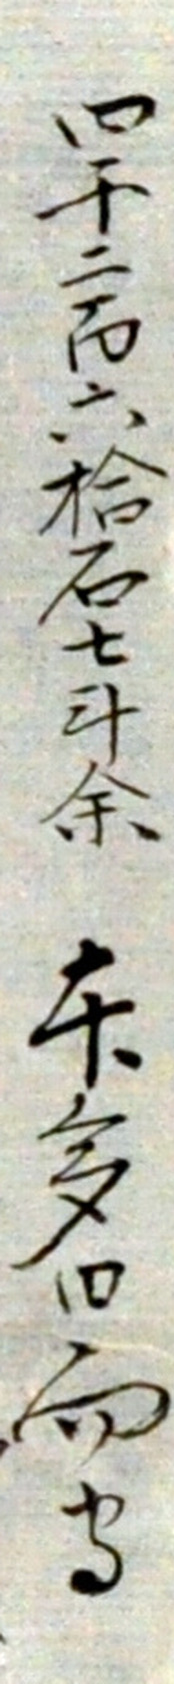四千二百六拾石七斗余本多日向守
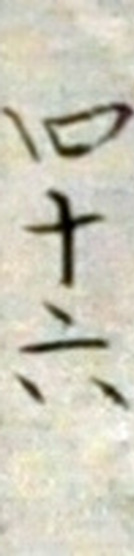四十六
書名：若年寄御役中御調書付
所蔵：伊那市立高遠町図書館・合同会社AMANE
